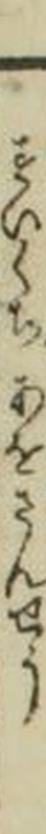すいくちあをさんせう
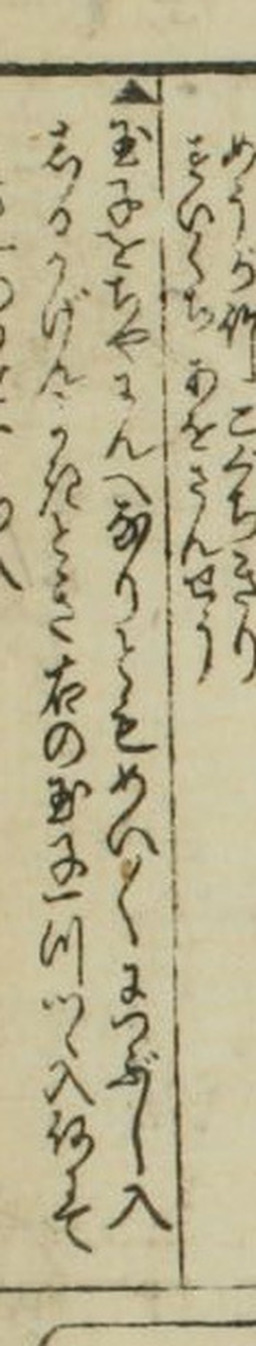▲玉子をちやわんへなりともめい〳〵につぶし入
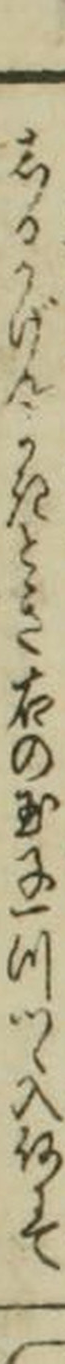しるかげんよきとき右の玉子一つつゝ入何にて
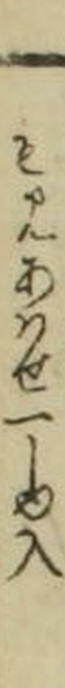も見あはせ一しゆ入

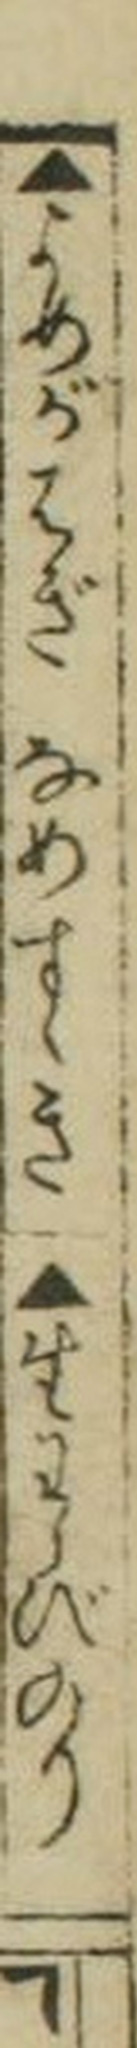▲よめがはぎなめすゝき▲生わらびのり
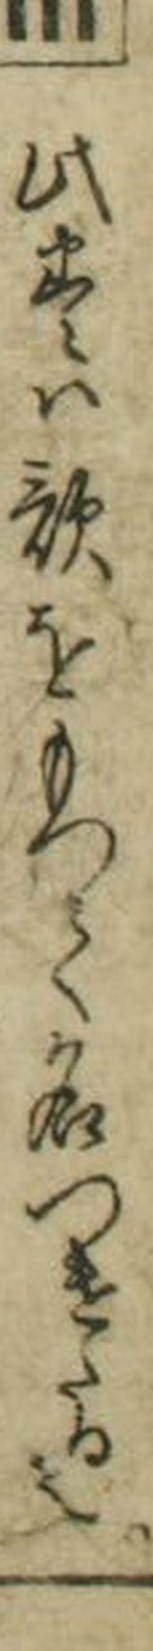此巻は歌をもつて名つけたる也。
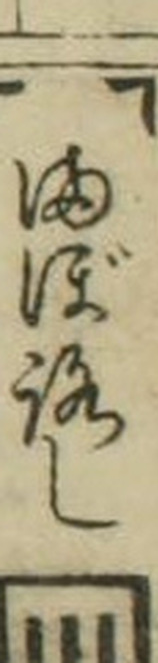まぼろし
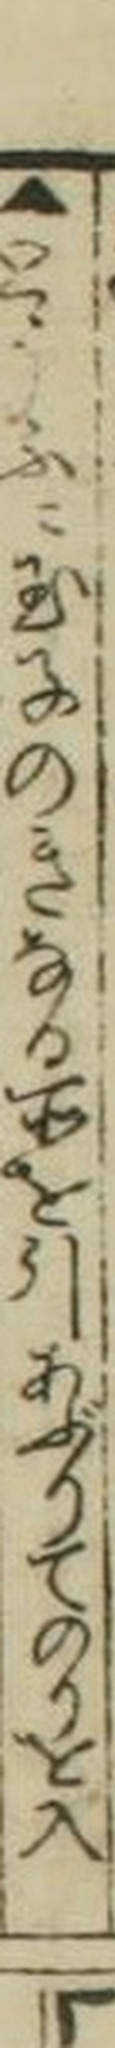▲とうふに玉子のきなる所を引あぶりてのりを入
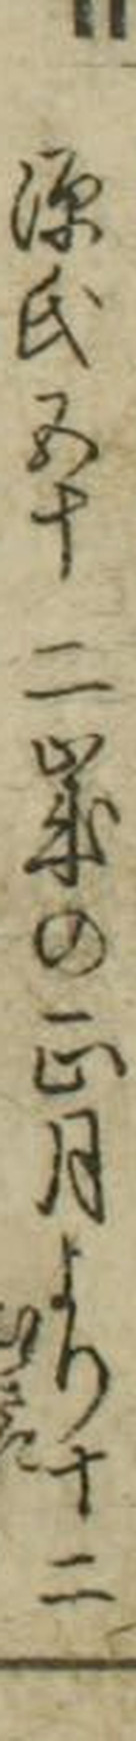源氏五十二歳の正月より十二
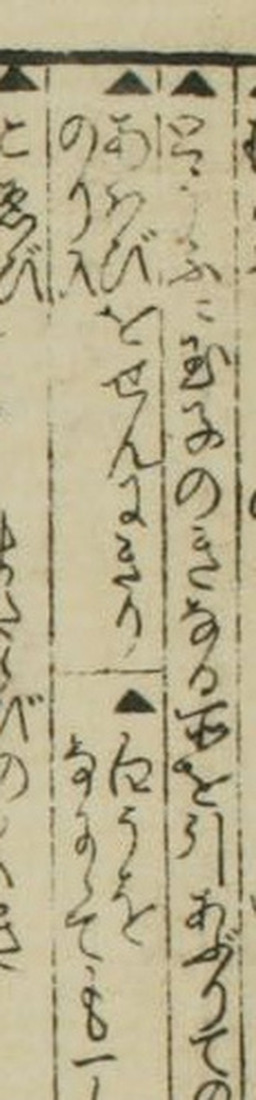▲あはびをせんにきり▲白うを
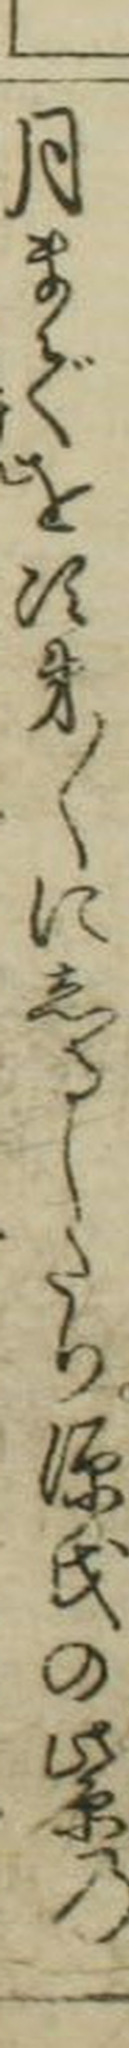月なでを次第〳〵にしるしたり。源氏の紫の
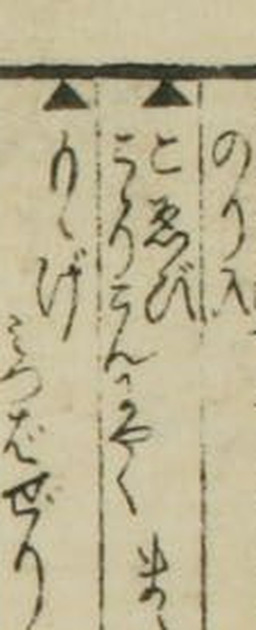こゝりこんにやく
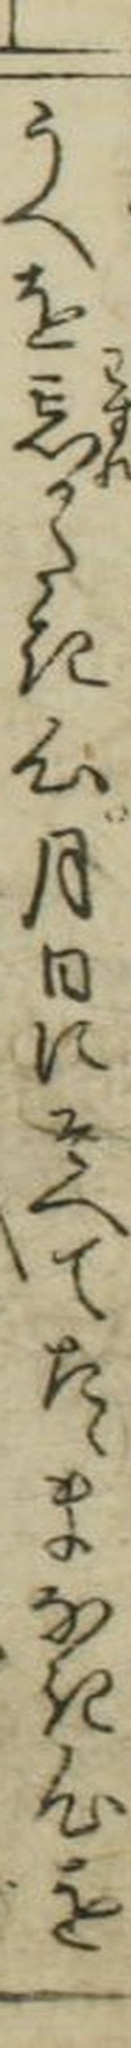うへを忘かたき心。月日にそへてたゝまなき心を
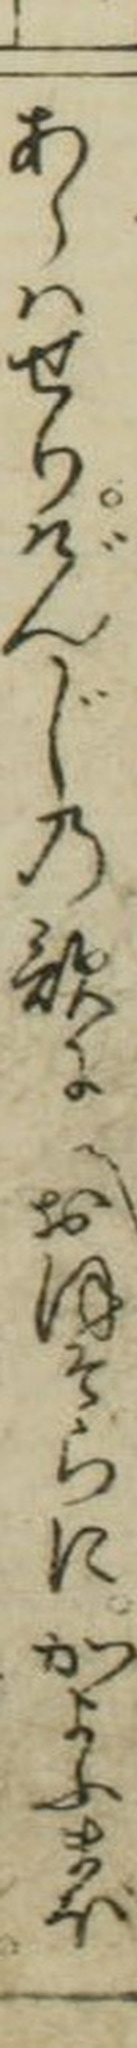あらはせり。げんじの歌に〽おほそらに。かよふまぼ
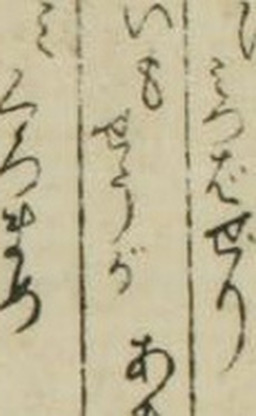せうが
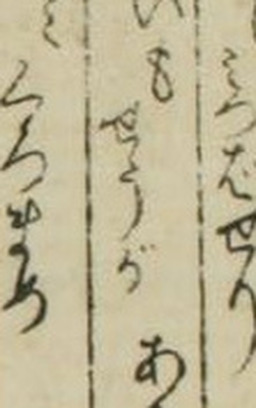せうが
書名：女源氏教訓鑑
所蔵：東京学芸大学附属図書館
